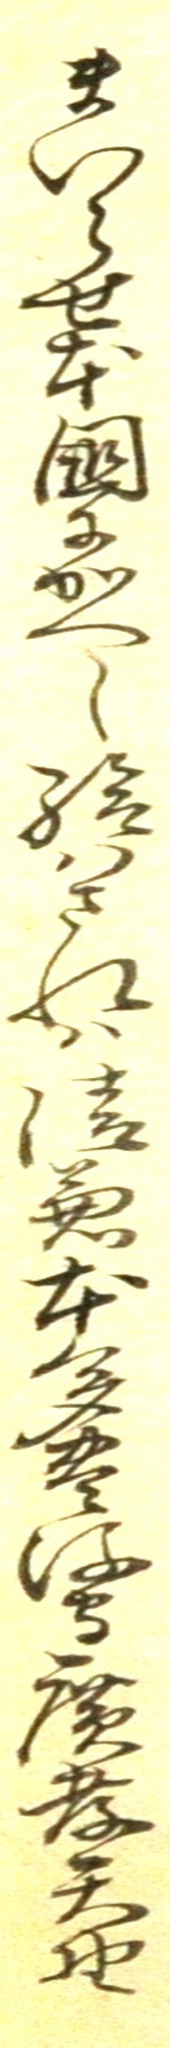まいらせ本国にかへし給はされは清兼本多豊後守廣孝天野

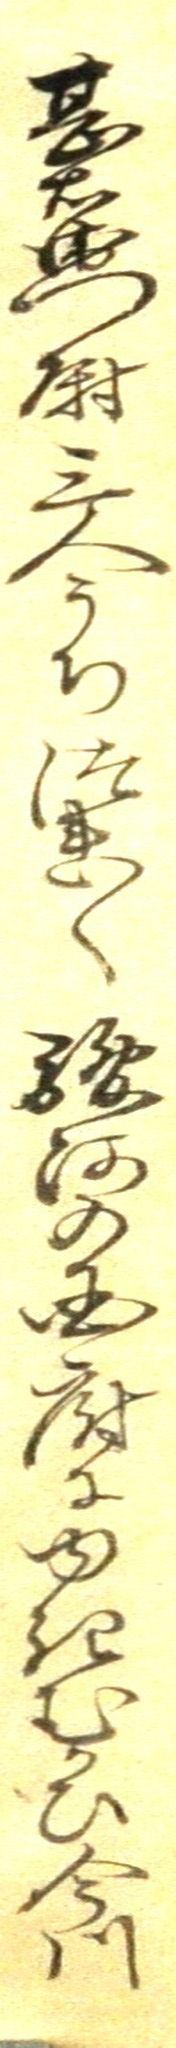甚右衛門尉三人うちつれ〳〵駿河の国府にゆきむかひ今川
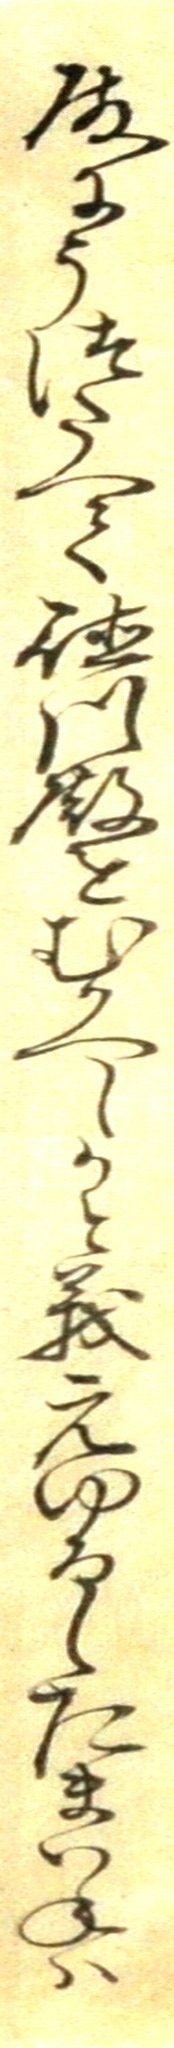殿にうつたへて徳川殿をむかへしかと義元ゆるしたまはねは
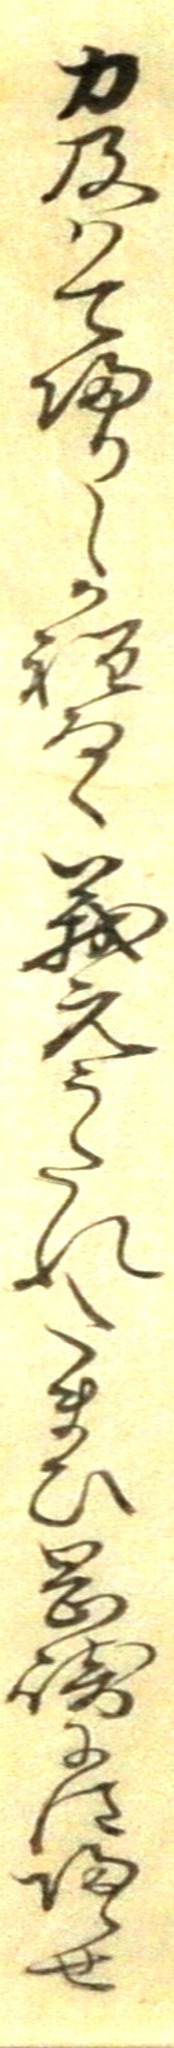力及はて帰りしか程なく義元うたれたまひ岡崎には帰らせ
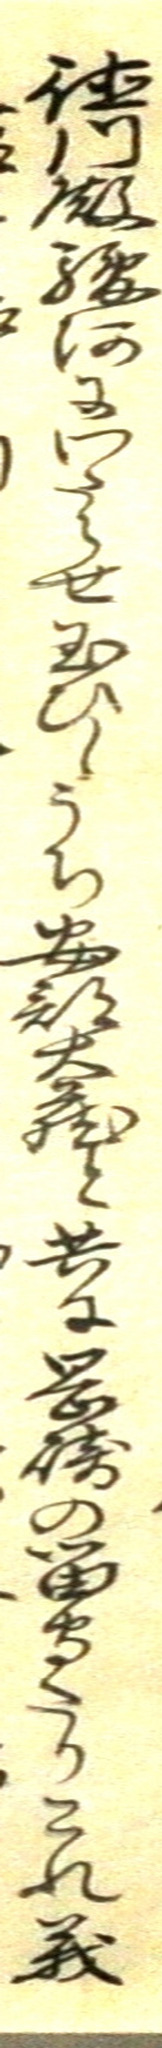徳川殿駿河にわたらせ玉ひしうち安部大蔵と共に岡崎の留守たりこれ義
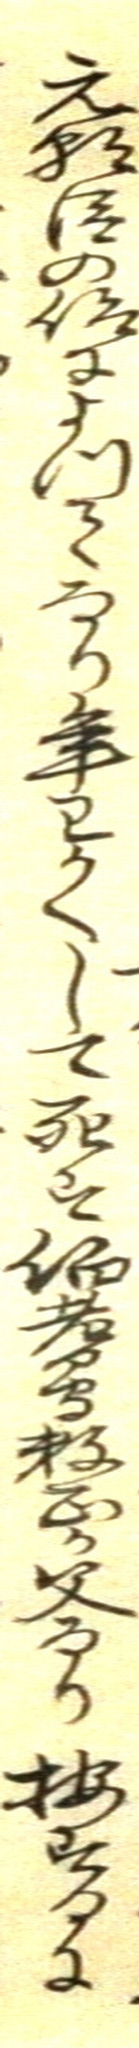元朝臣の仰によつてなり年わかくして死す伯耆守数正か父なり按するに
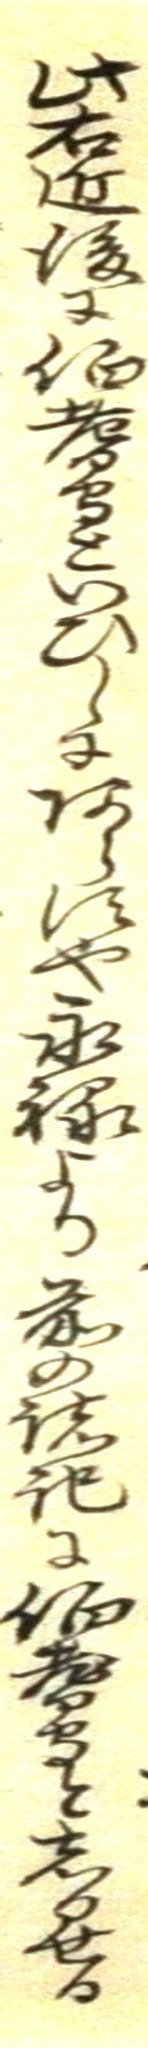此右近後に伯耆守といひしにあらすや永禄より前の諸記に伯耆守としるせる
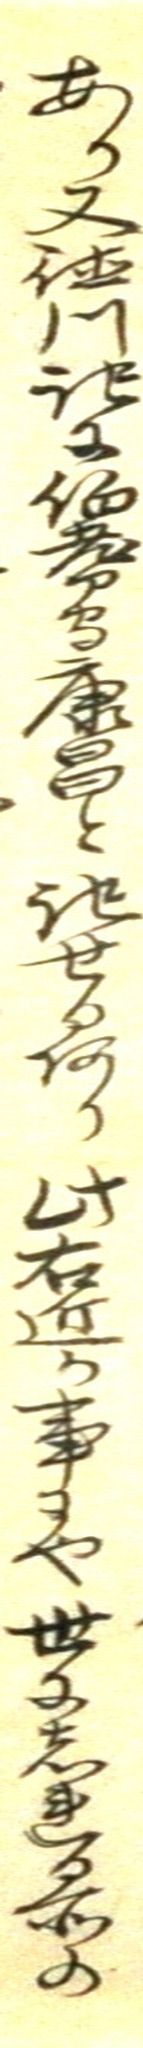あり又徳川記に伯耆守康昌と記せつあり此右近か事にや世にしれる所の
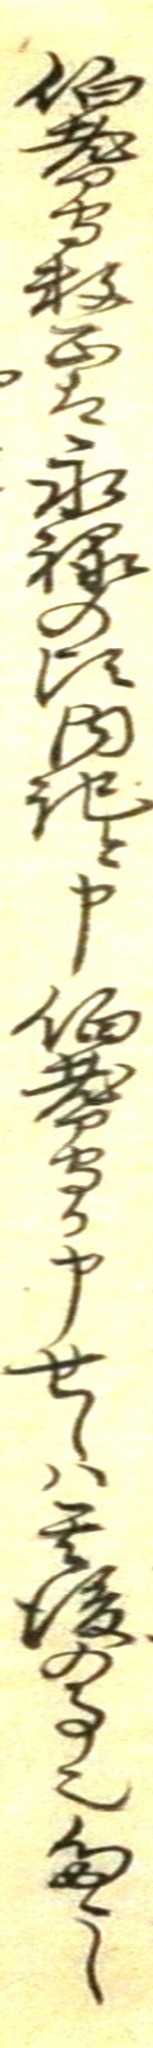伯耆守数正は永禄の頃内記と申伯耆守か申せしは其後の事也たゝし
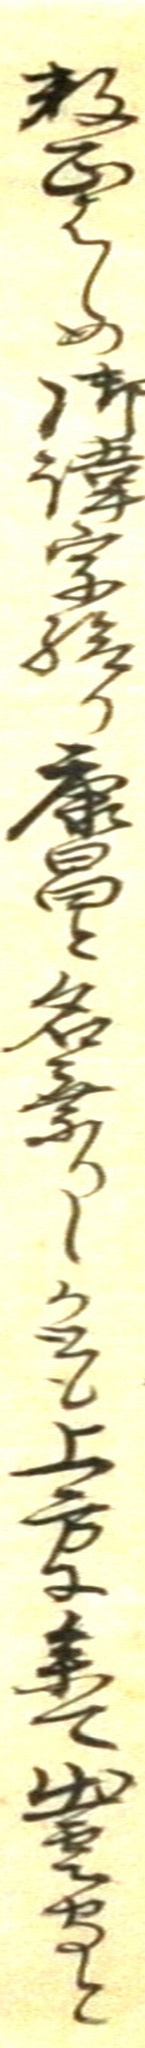数正はしめ御諱字給り康昌と名乗りしかとも上方に参て出雲守と
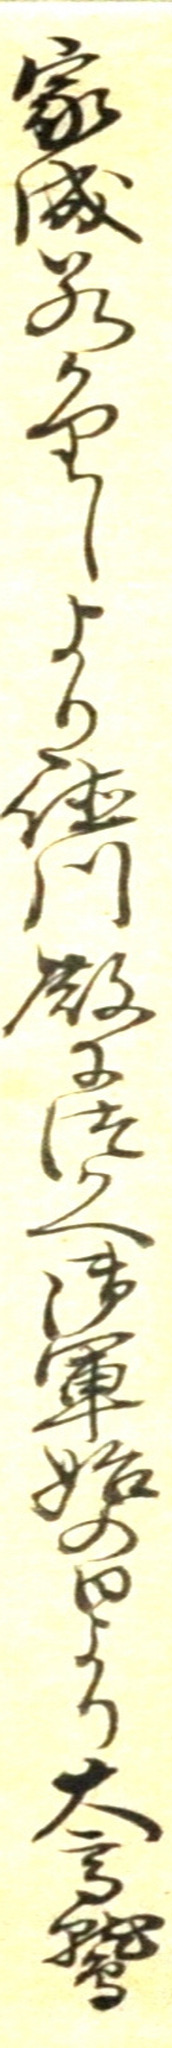家成若かりしより徳川殿につかへ御軍始の日より大高鷲
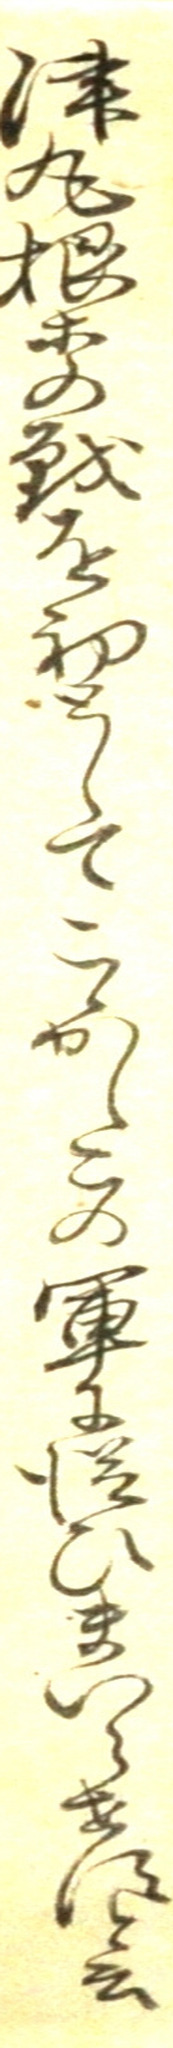津丸根等の戦を初としてこゝかしこの軍に従ひまいらせすと云
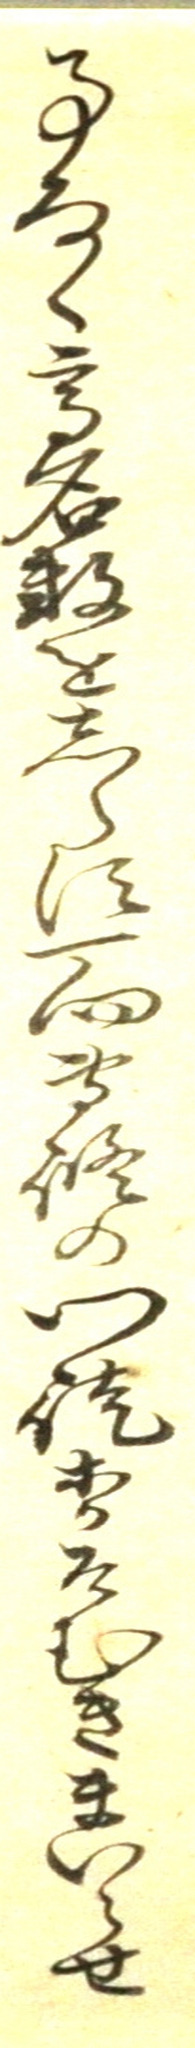事なく高名数をしらす一向専修の門徒等かそむきまいらせ
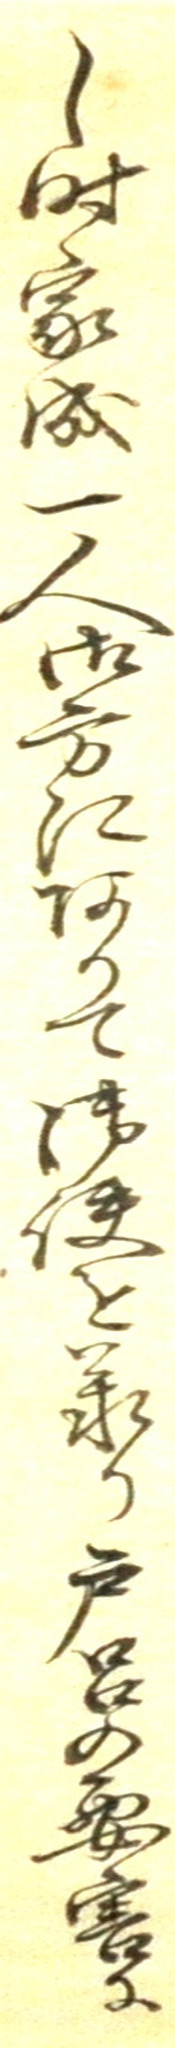し時家成一人御方にありて御使を承り戸呂の要害に
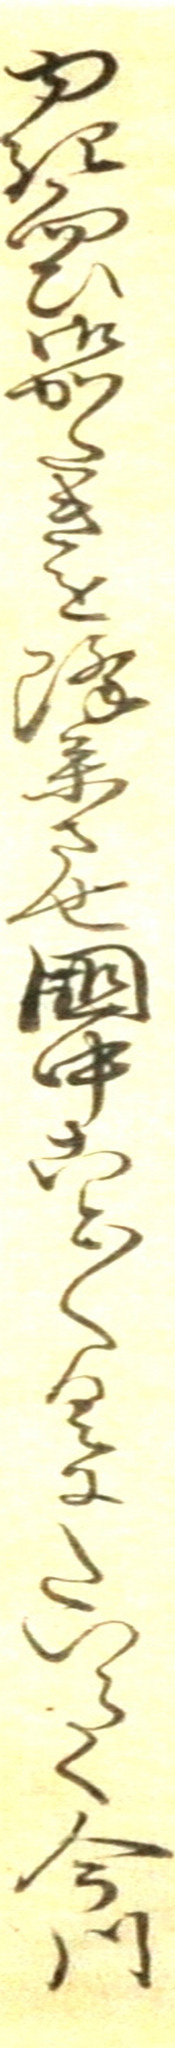ゆき向ひ御かたきを降参させ国中こと〳〵くにたいらく今川
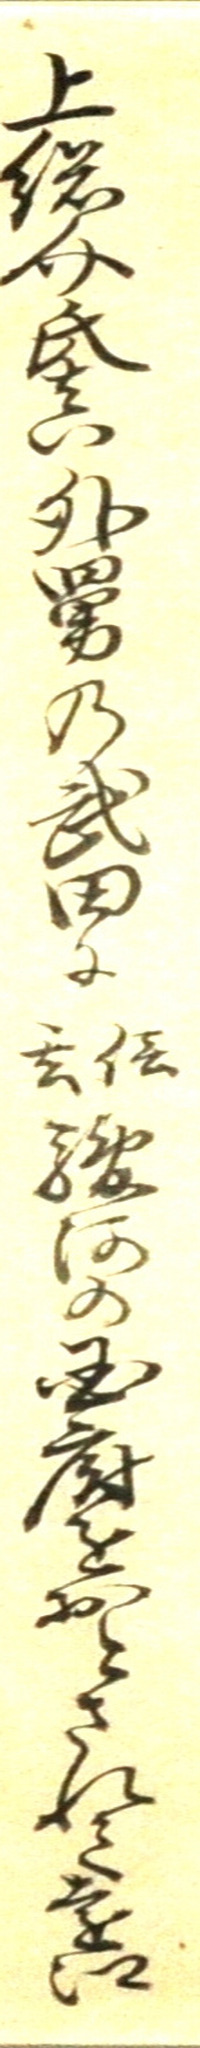上総介氏真外舅乃武田に信玄駿河の国府をおとされて遠江
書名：藩翰譜（四・中）
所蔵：伊那市立高遠町図書館・合同会社AMANE
